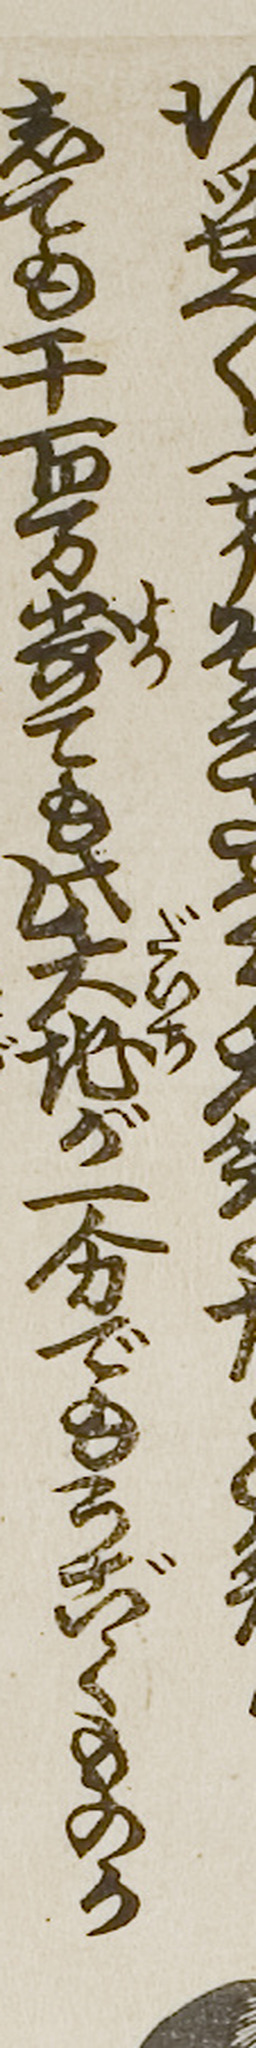しても千百万寄ても此大地が一分でもうごくものか
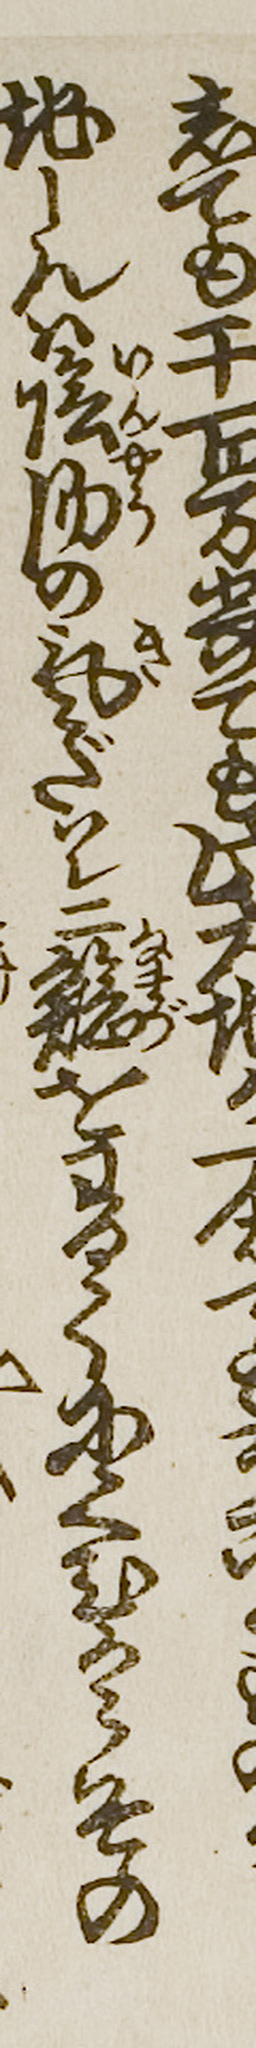地しん陰陽の気だそれに鯰をわるくにくむからその
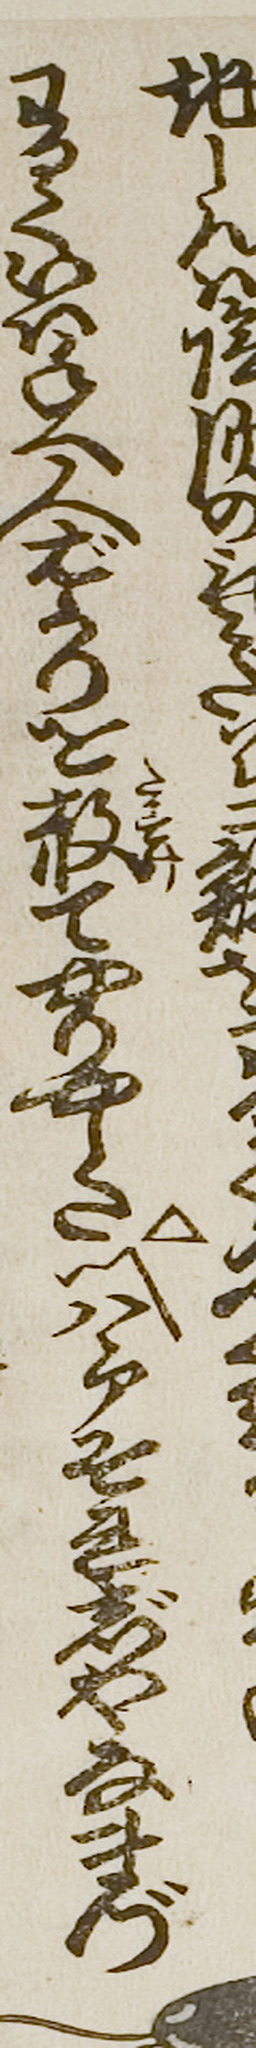わるくいわねえ人ばかりを赦てやりやした△〽︎ははあそれじやなまづ
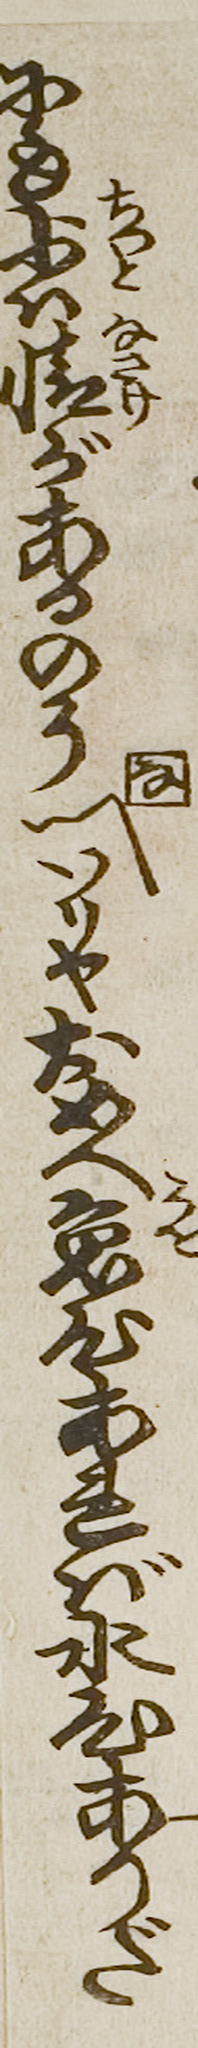にも少は情があるのかな〽︎そりやおめへ魚心あれば水心ありだ
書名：世直し鯰の情
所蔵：東京大学総合図書館 General Library in the University of Tokyo, JAPAN
